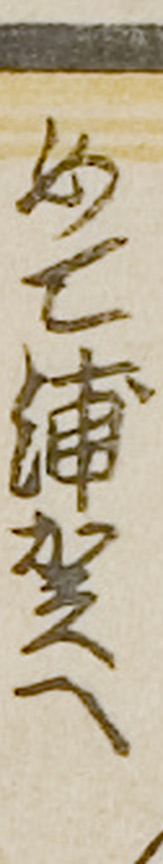めて浦賀へ
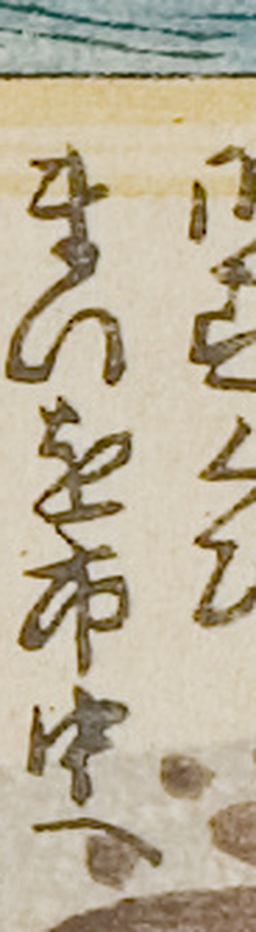まいを市中へ
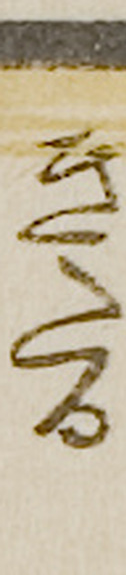きたる
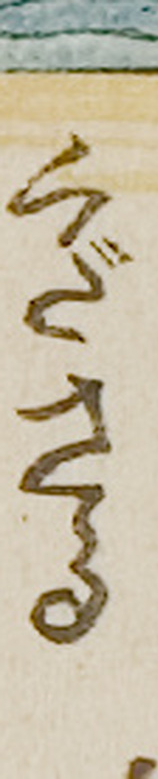くださる
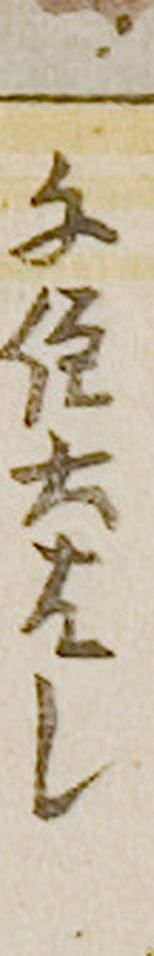千住大はし
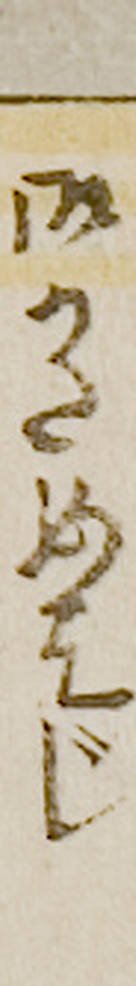御かためはじ
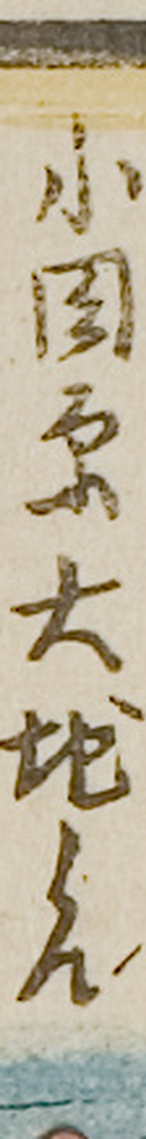小田原大地しん
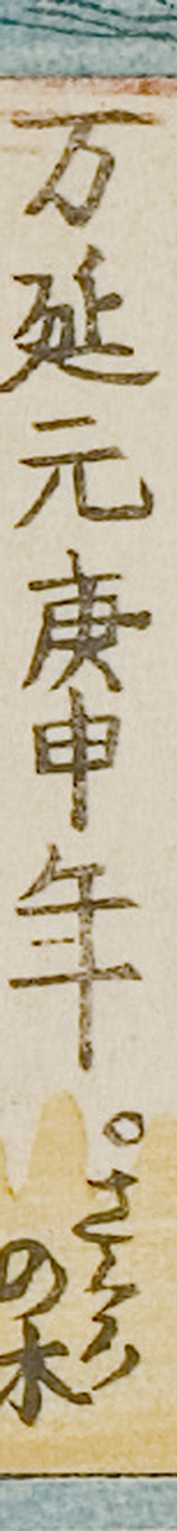万延元庚申年○さくろの木
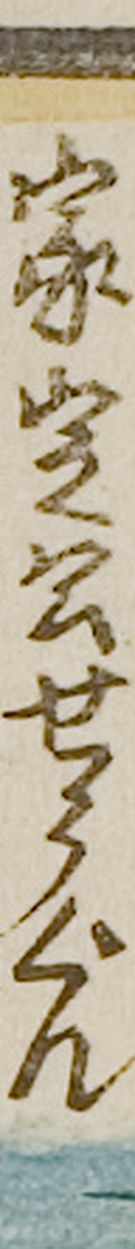家定公せうぐん
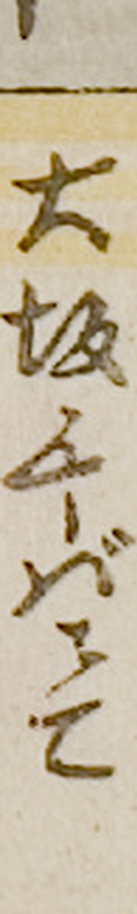大阪千ばにて
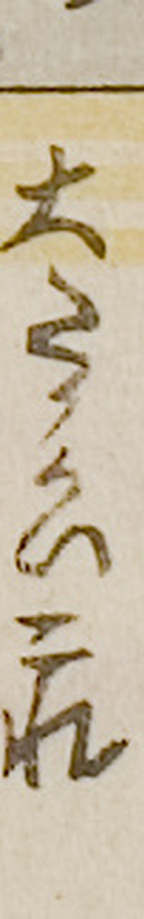大たゝかひこれ
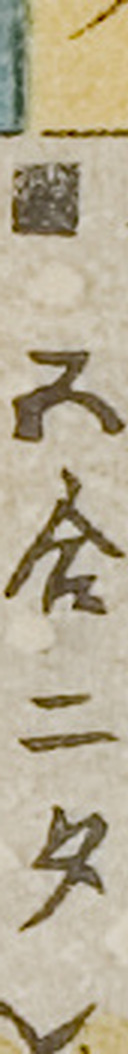五合二勺
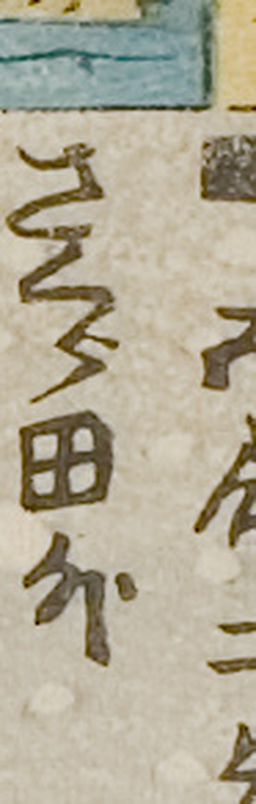さくら田外
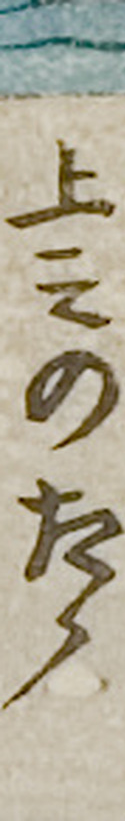上みのたゝ
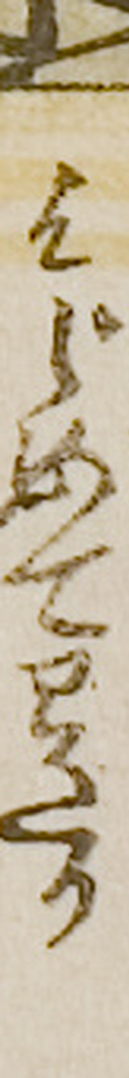はじめてわたり
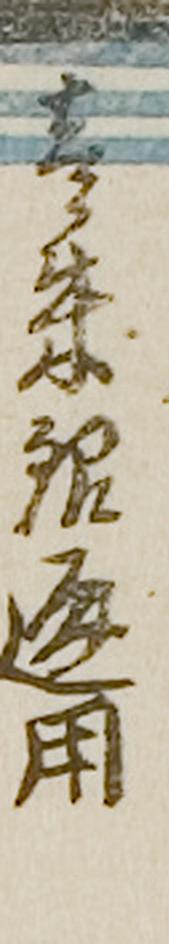壱朱銀通用
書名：嘉永年間より米相場直段并年代記書抜大新版
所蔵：東京大学総合図書館 General Library in the University of Tokyo, JAPAN
